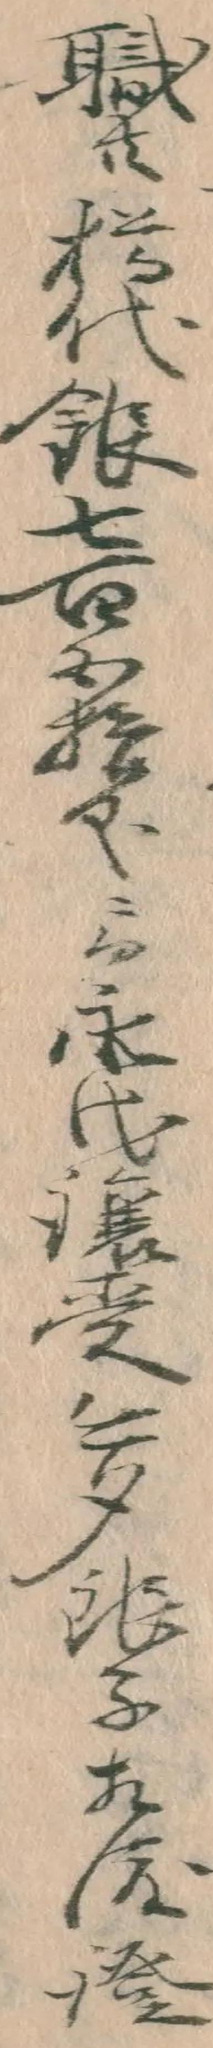職共樽代銀七百五拾匁ニ而永代譲受今夕銀子相渡證
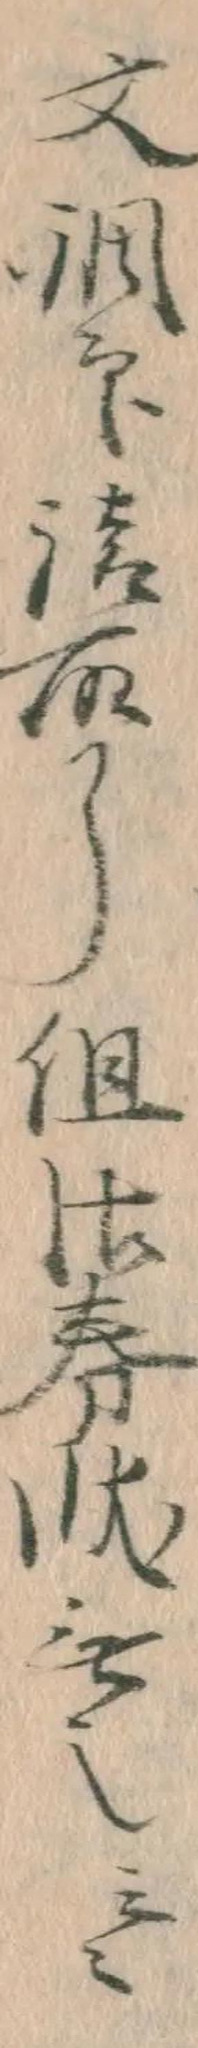文調印請取了但沽券状無之云々
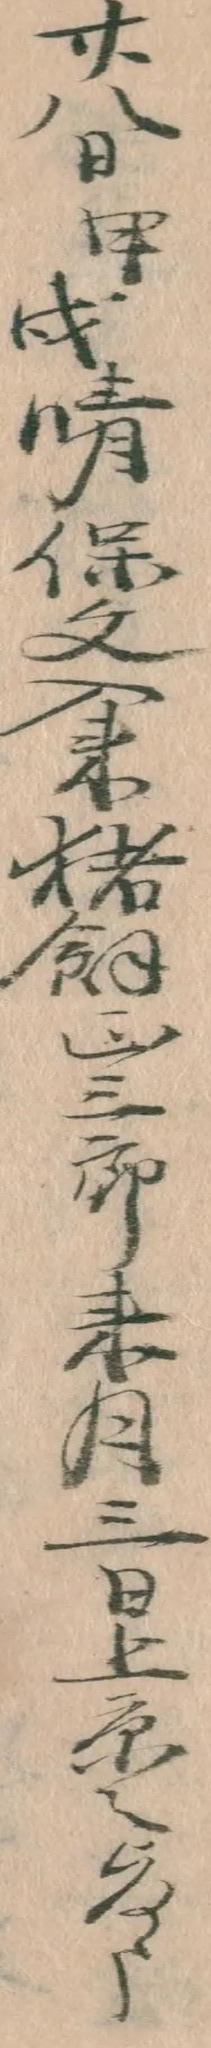廿八日甲戌晴保文入来猪飼正三郎来月三日上京之旨申
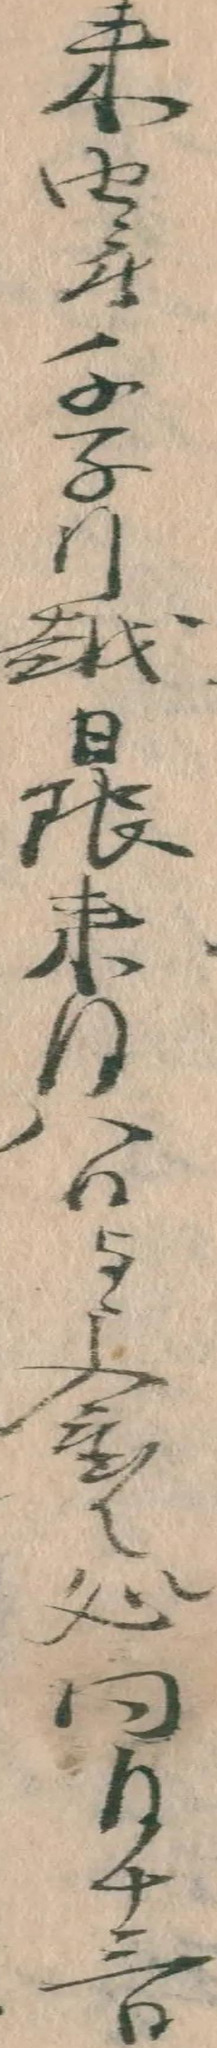来由ニ付千子引越日限来月八日と申入置之処同月十三日
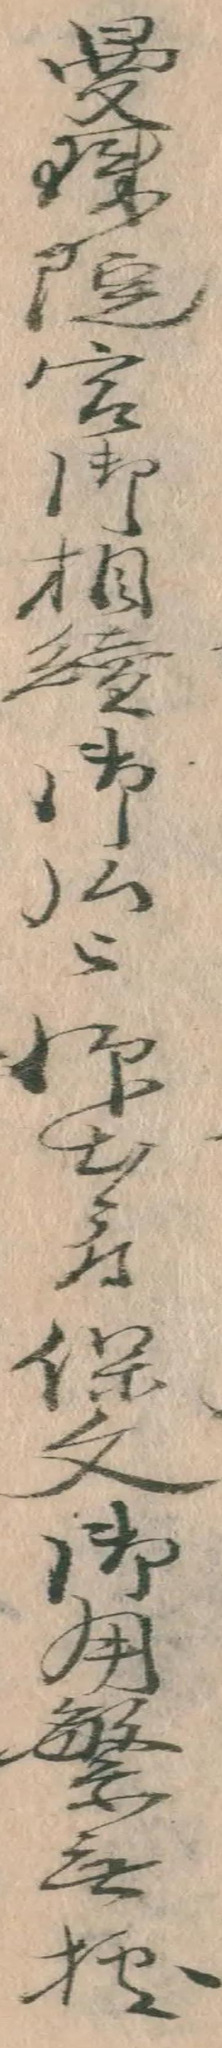曼珠院宮御相續御弘被仰出候ニ付保文御用繁無拠
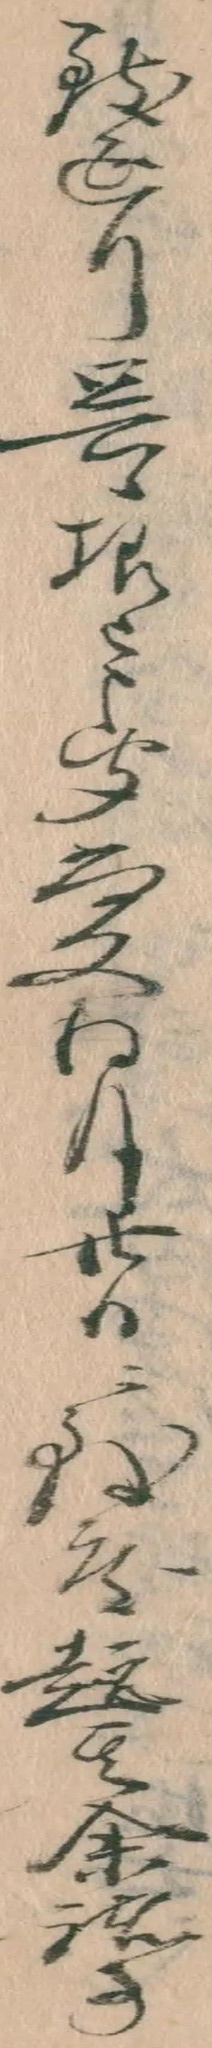致延引呉候様被申聞尚又同月廿日ニ致度趣其余諸事
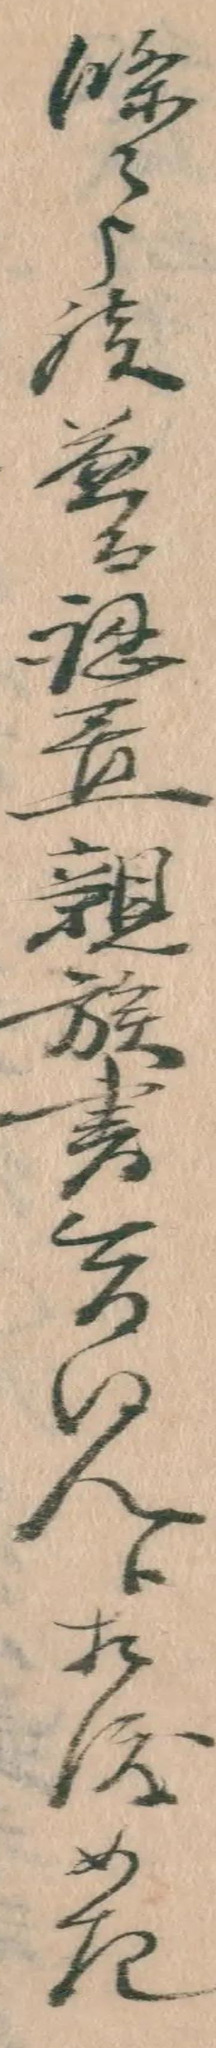條々申談兼而認置親族書今日同人え相渡如左
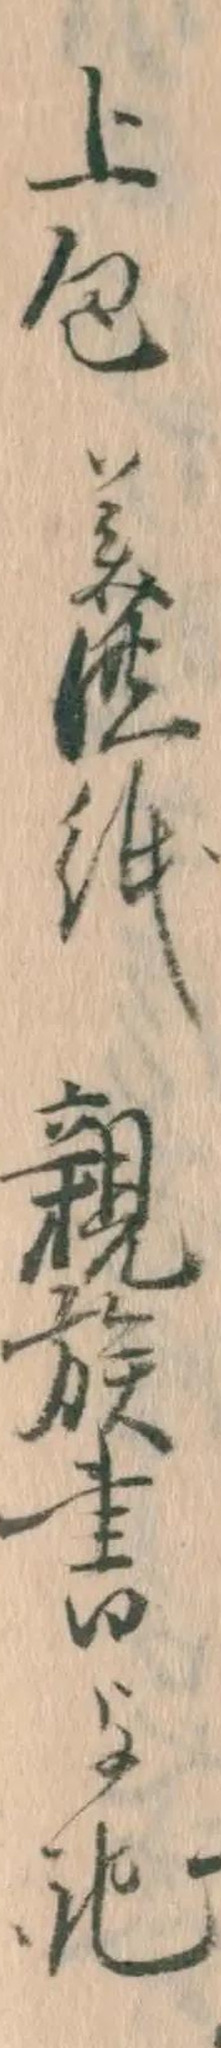上包美濃紙親族書と記
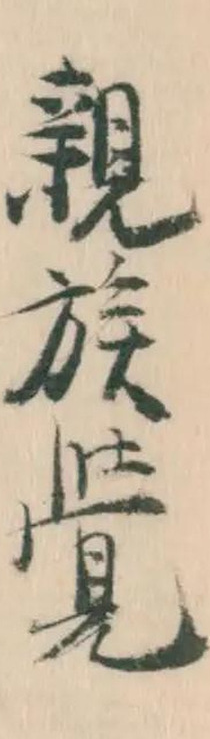親族覚
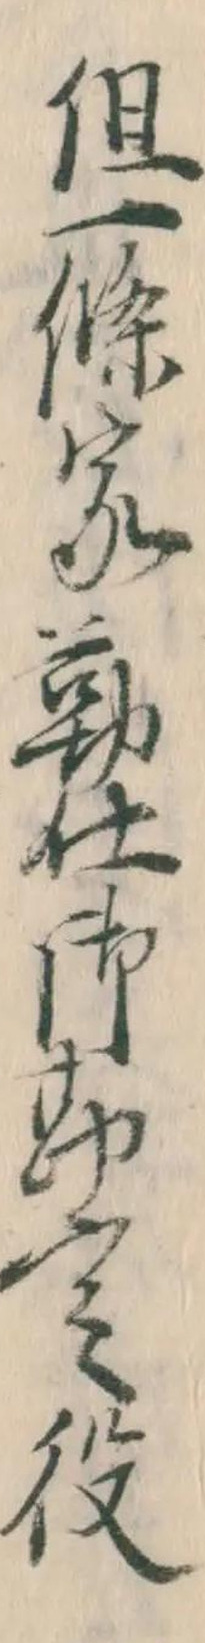但一條家勤仕御近習
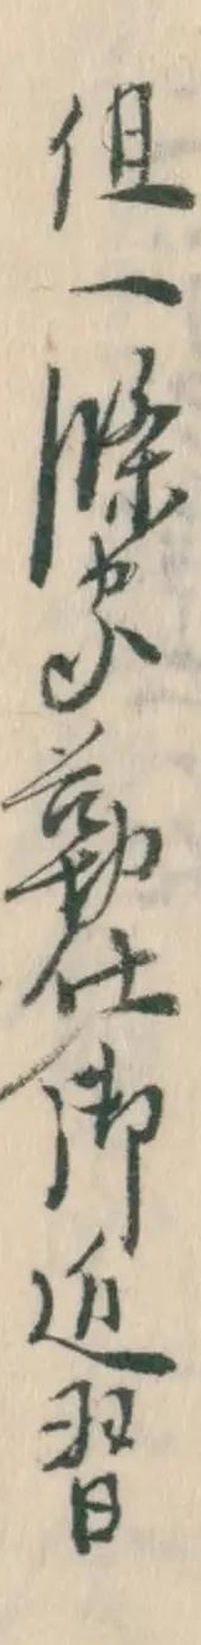但一條家勤仕御近習

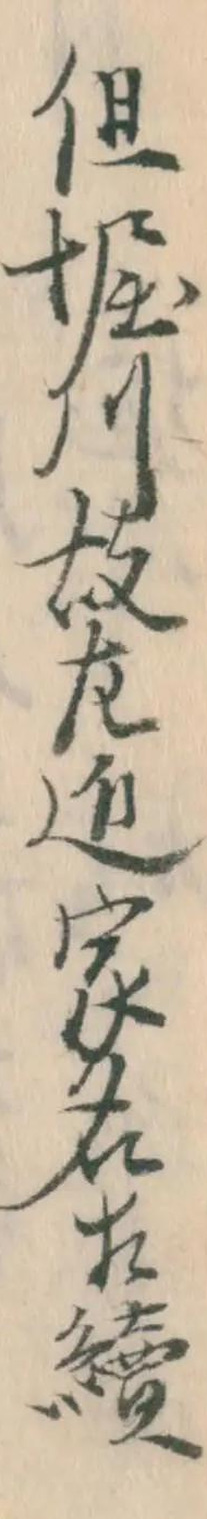但堀川故左近家名相続
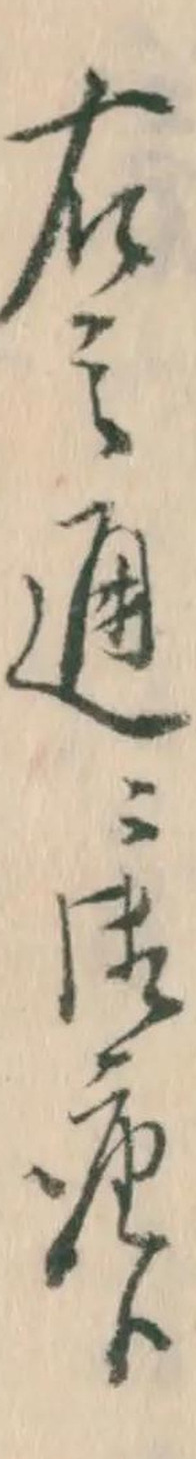右之通ニ御座候
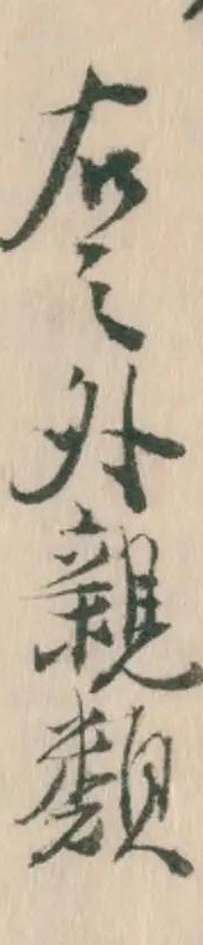右之外親類
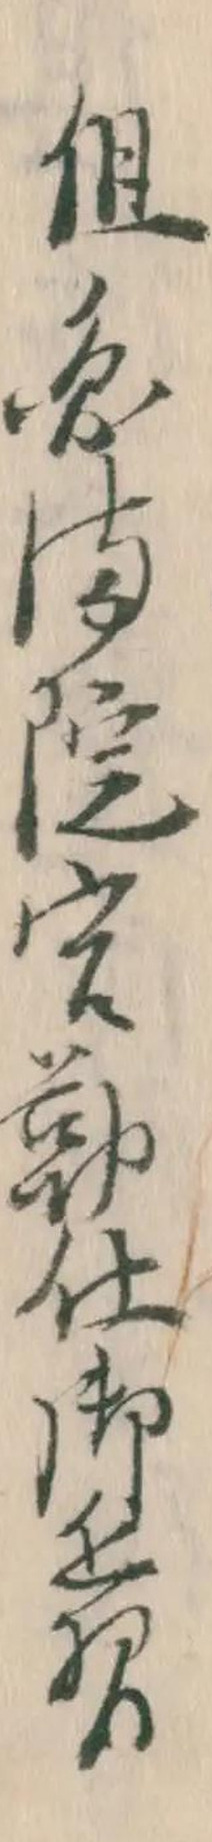但円満院最勤仕御近習
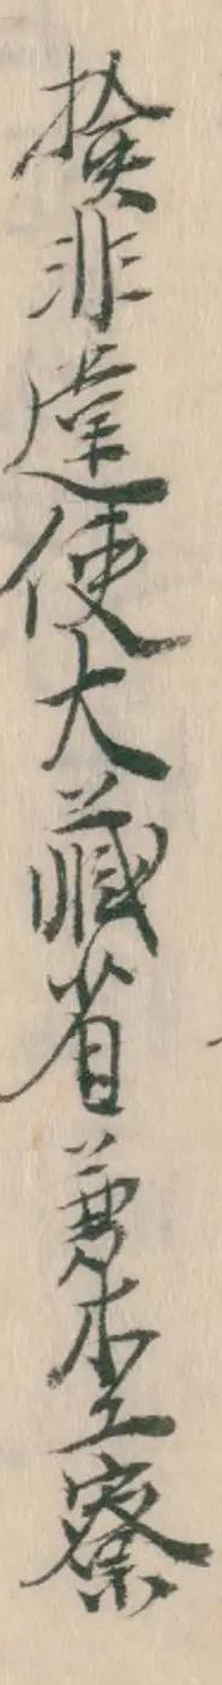検非違使大蔵省兼木工寮
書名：賀茂社記録. 第66冊
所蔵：国立国会図書館 National Diet Library, JAPAN
